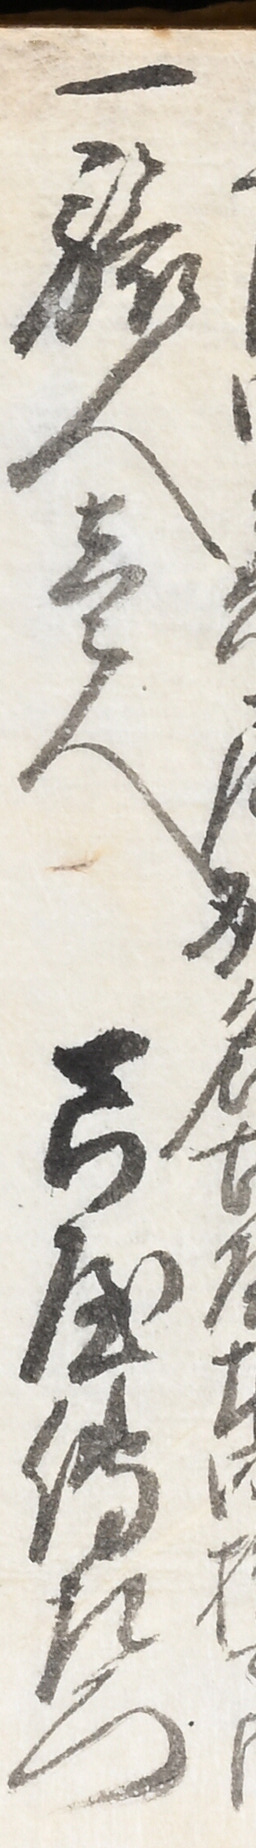一旅人壱人弓屋伝左衛門
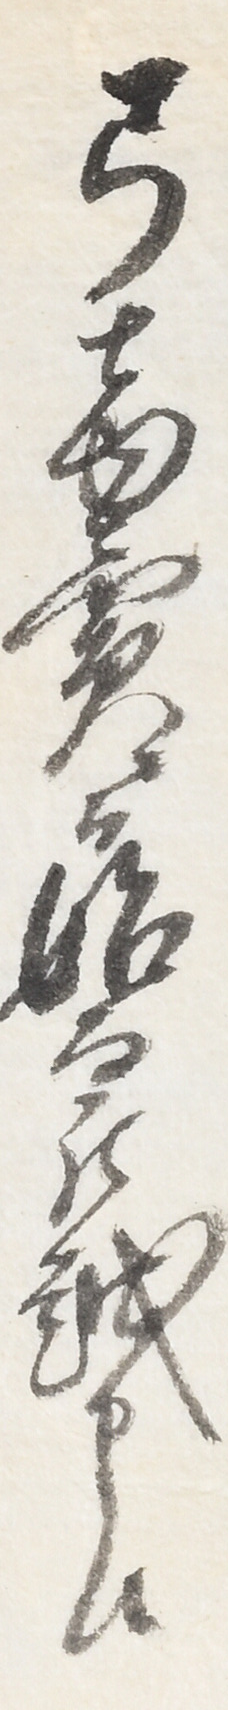弓商売ニ而始而罷越申候
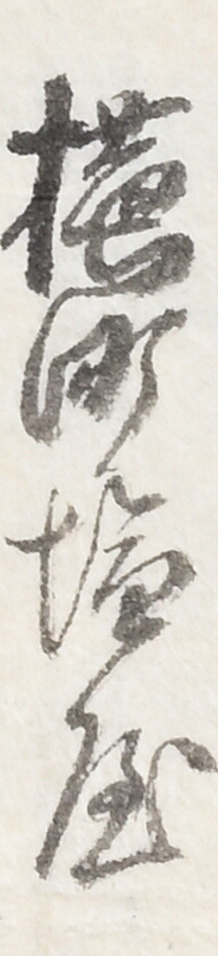横町塩屋
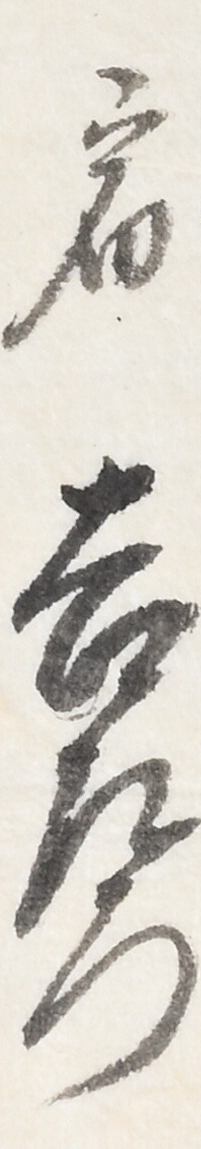宿吉左衛門
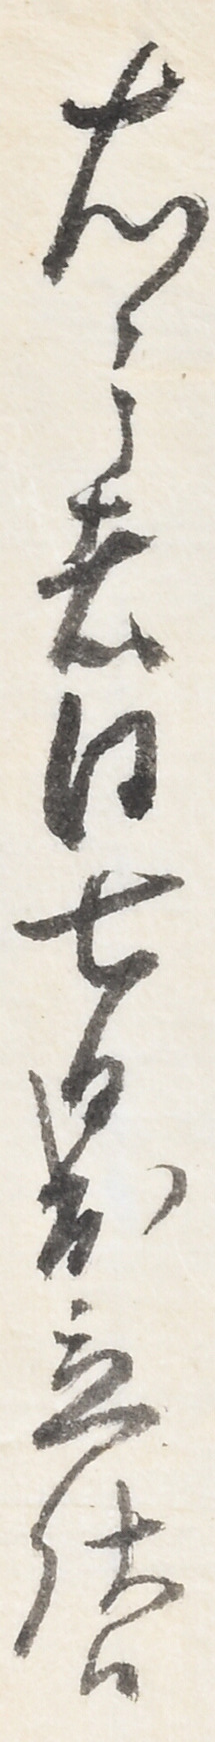右之者同七日出立仕候
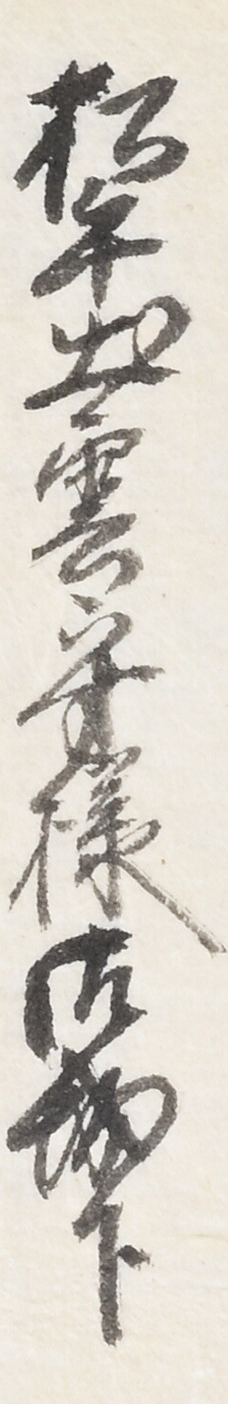松平出雲守様御城下
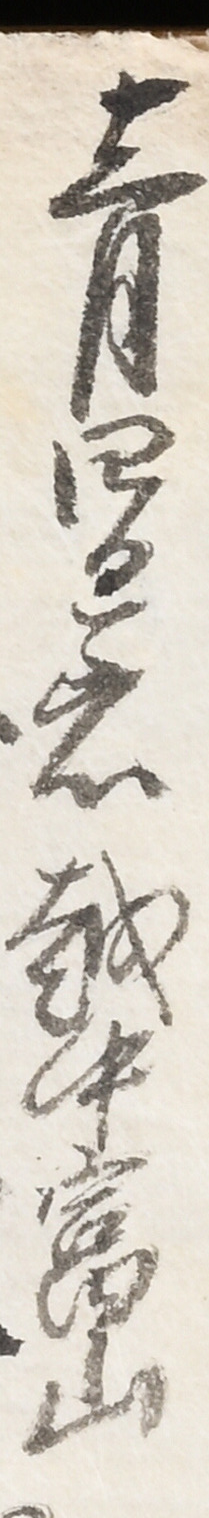十二月四日着越中富山
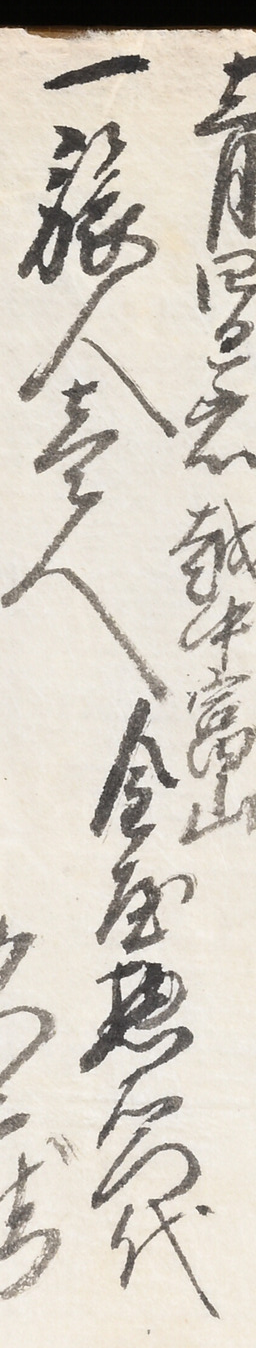一旅人壱人弓屋伝左衛門
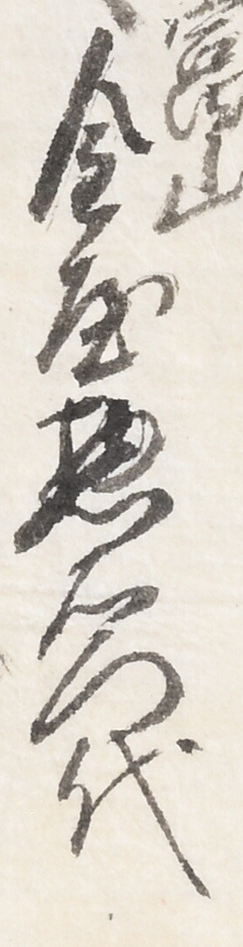金屋惣右衛門代
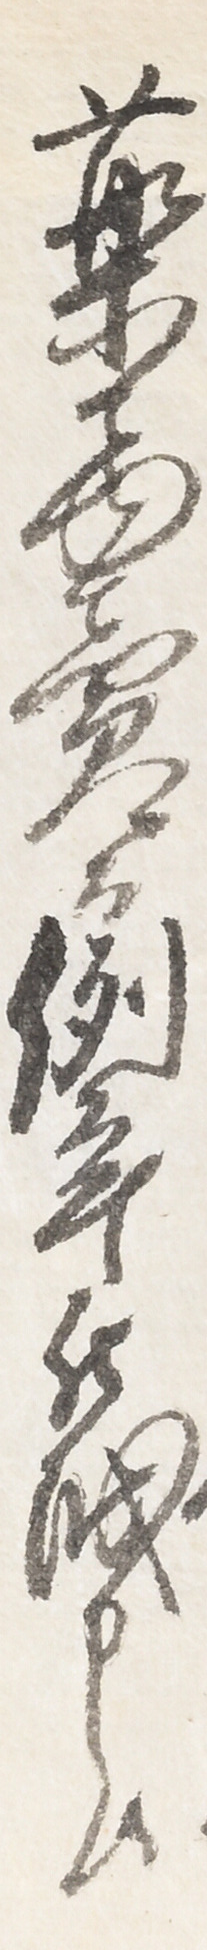薬商売ニ而例年罷越申候
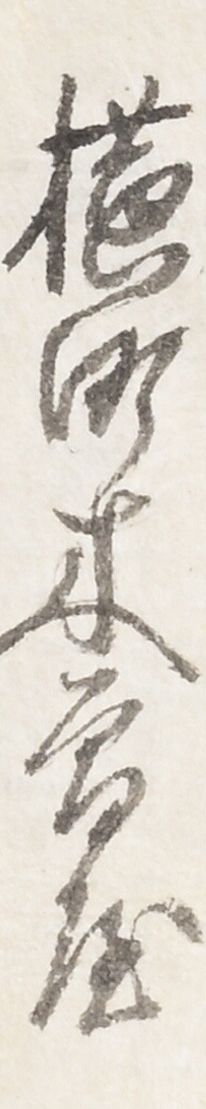横町木曽屋
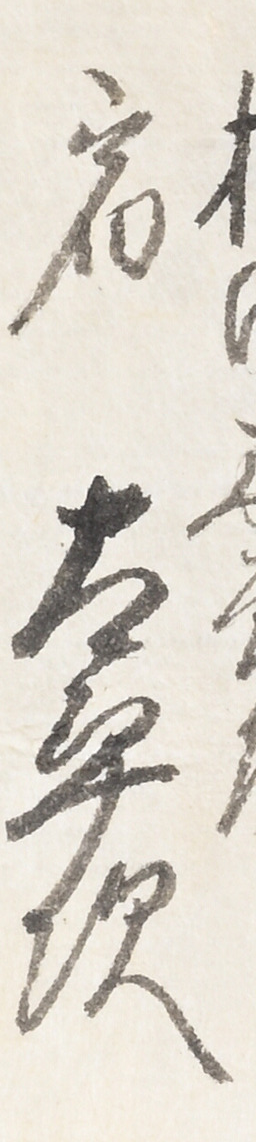宿太平次
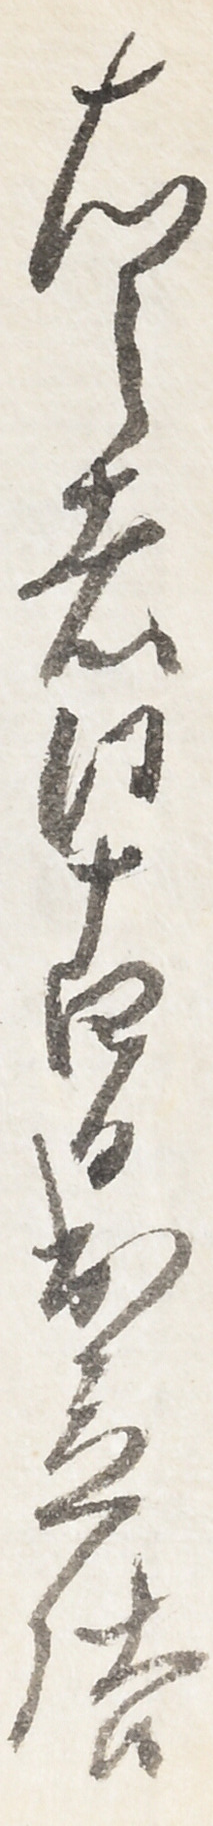右之者同十四日出立仕候
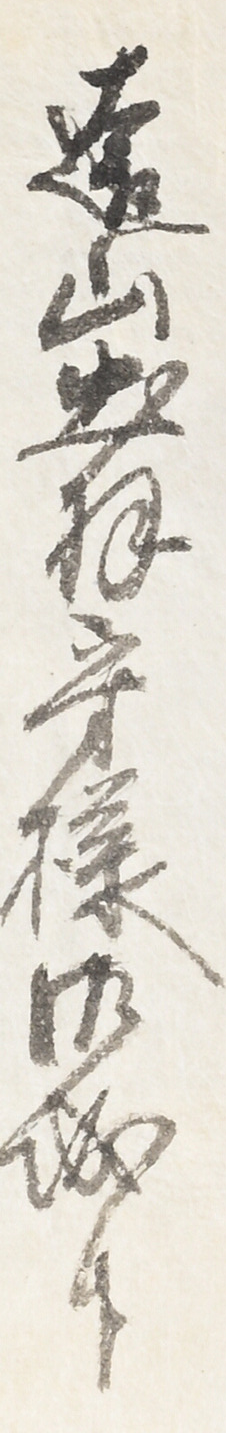遠山出羽守様御城下
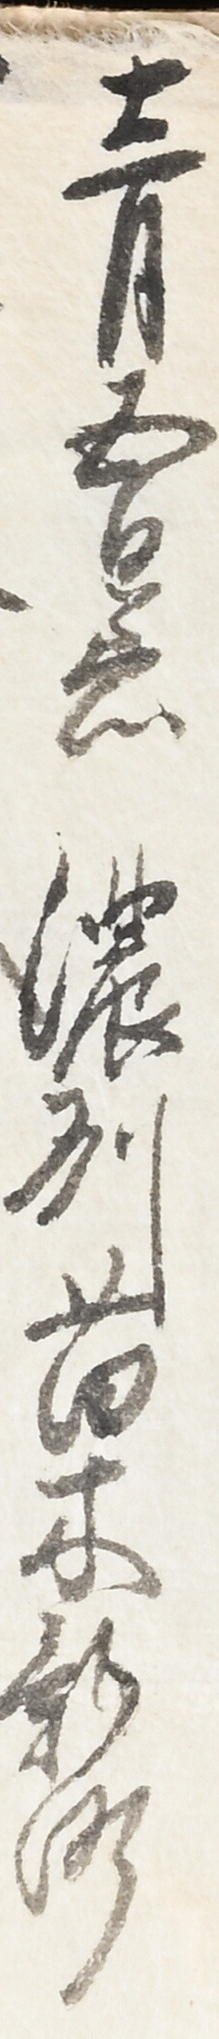十二月五日着濃州苗木新町
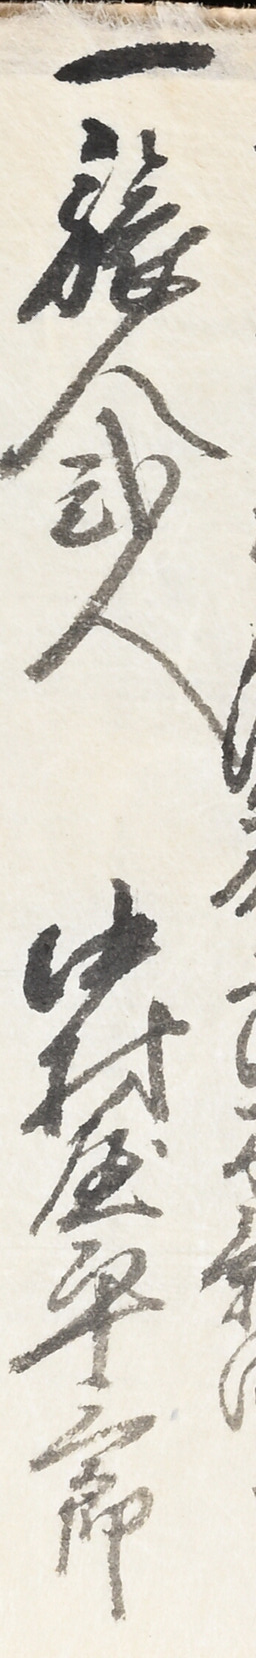一旅人弐人中村屋平三郎
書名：旅人泊控帳
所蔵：伊那市立高遠町図書館・合同会社AMANE
